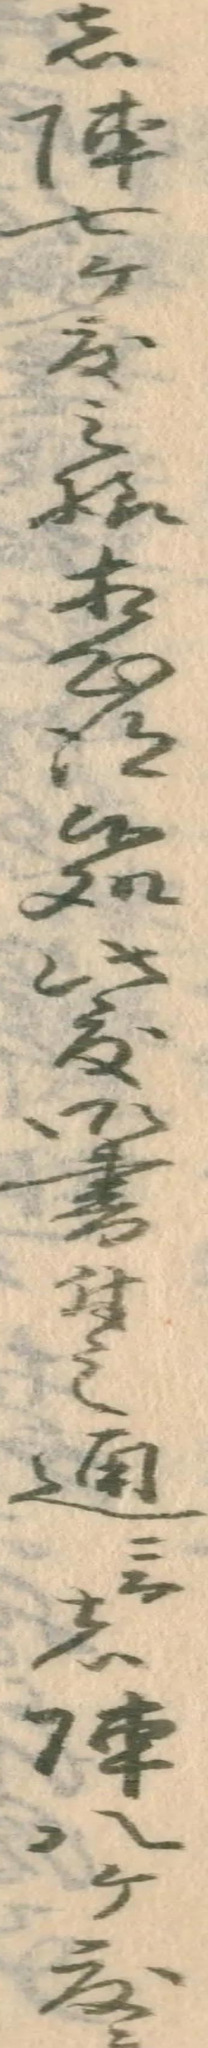は陣七ヶ度之様相心得候処此度御書付之通ニ而は陣八ヶ度ニ
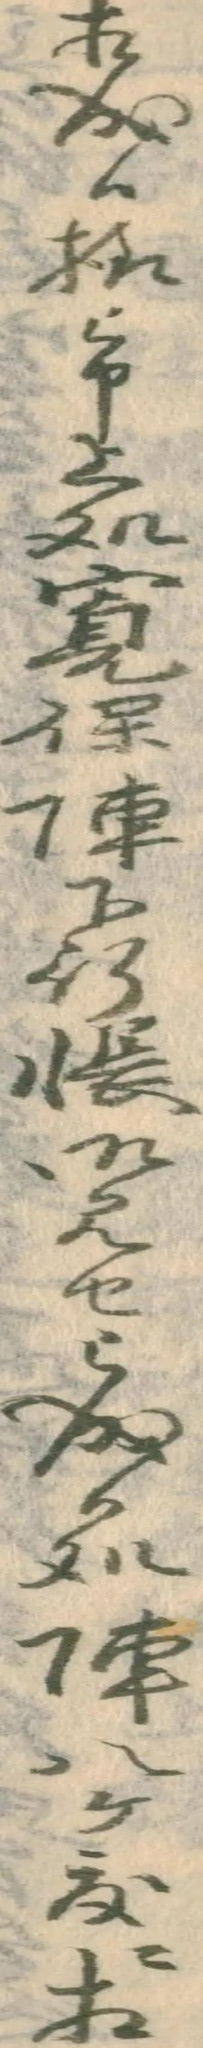相成候様被申上処寛保陣下行帳御見セ被成候処陣八ヶ度ニ相
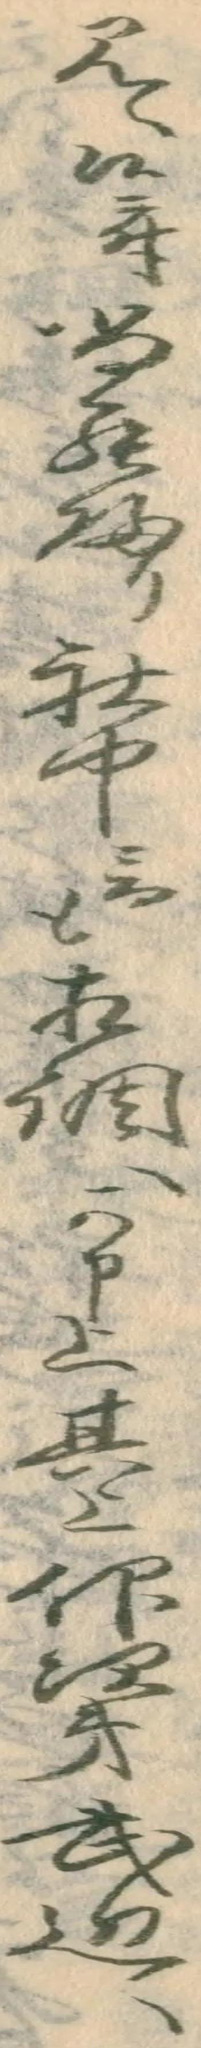見へ候ニ付尚罷帰り社中ニ而も相調へ可申上其上仰次第武辺へ
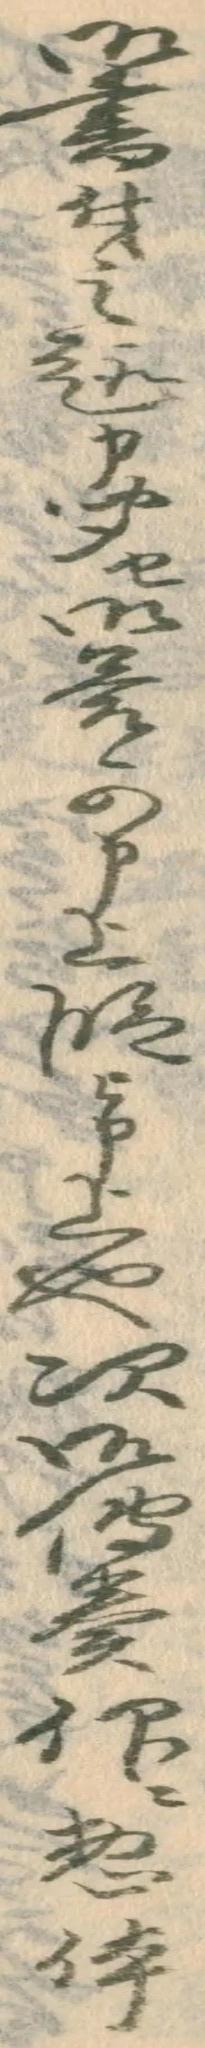御書付之趣申聞セ御答可申上段被申上也次御伝奏仰ニ惣体
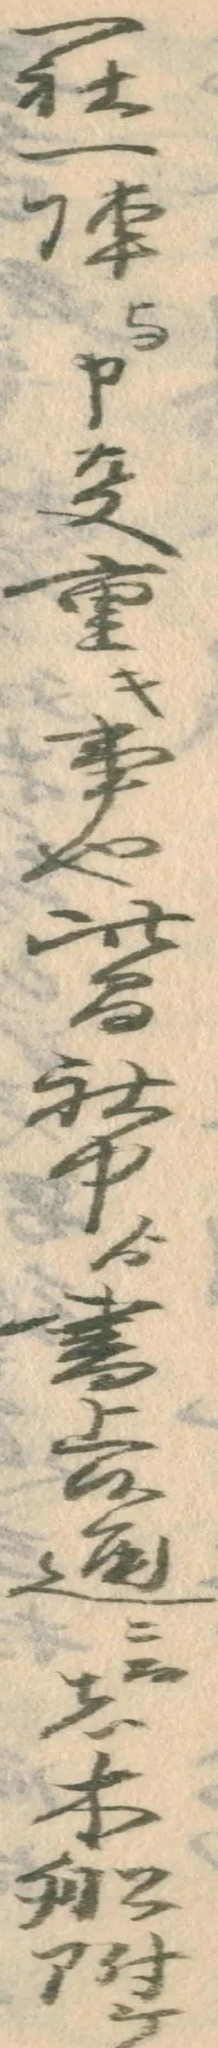一社一陣与申事重キ事也此間社中ゟ書上候通ニ而は木船附ケ
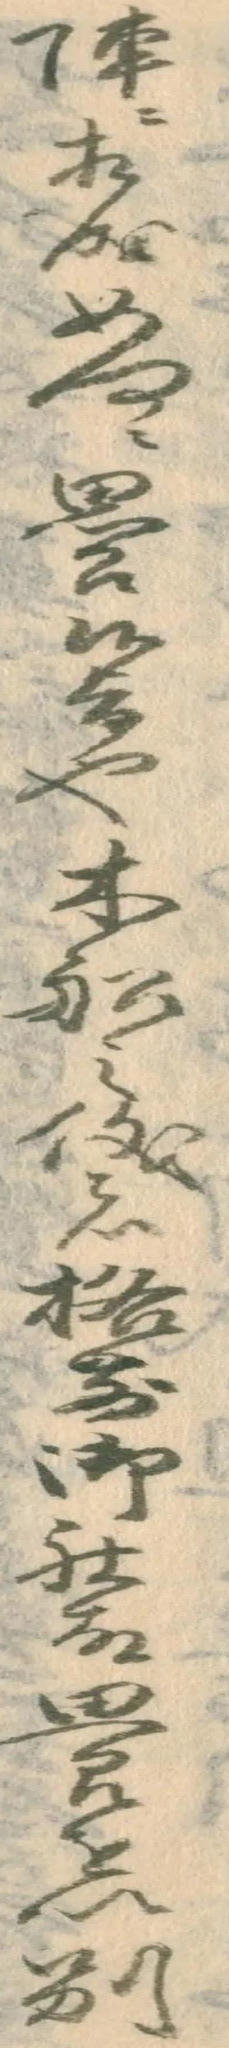陣ニ相成如何ニ思召候旨也木船之儀は格別御社故思召を以別
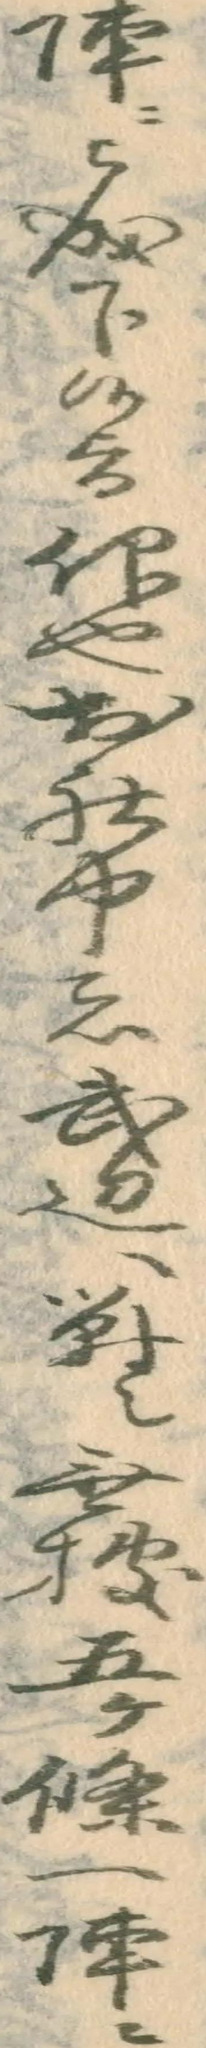陣ニ被成下候旨仰也於社中は武辺へ対シ無拠五ヶ条一陣ニ
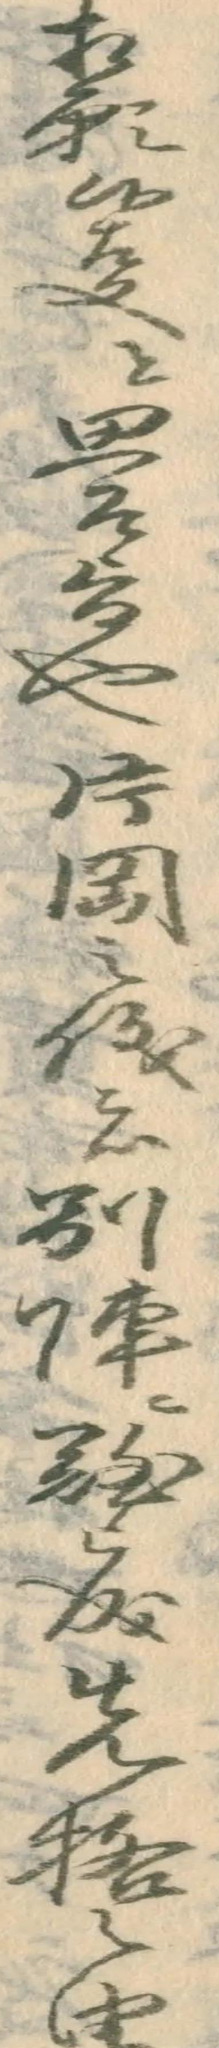相願候事と思召旨也片岡之儀は別陣ニ難被成先格之由

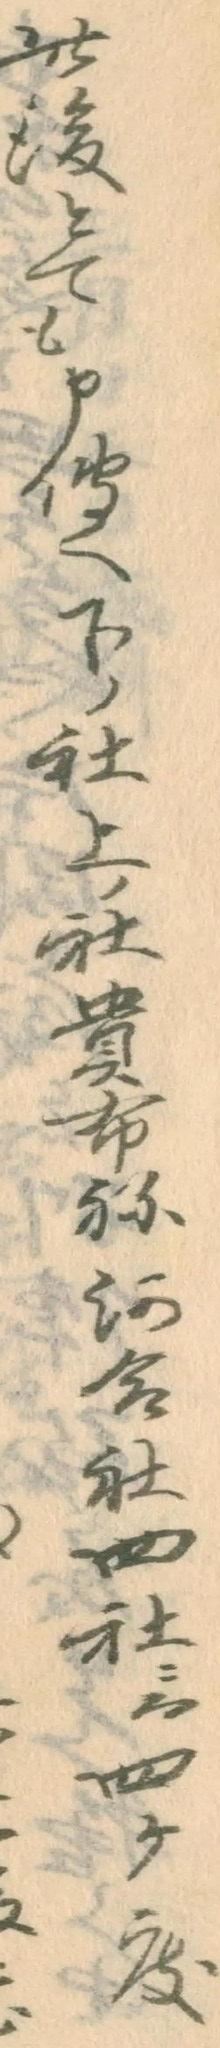此後とても申伝へ下ノ社上ノ社貴布祢河合社四社ニ而四ヶ度
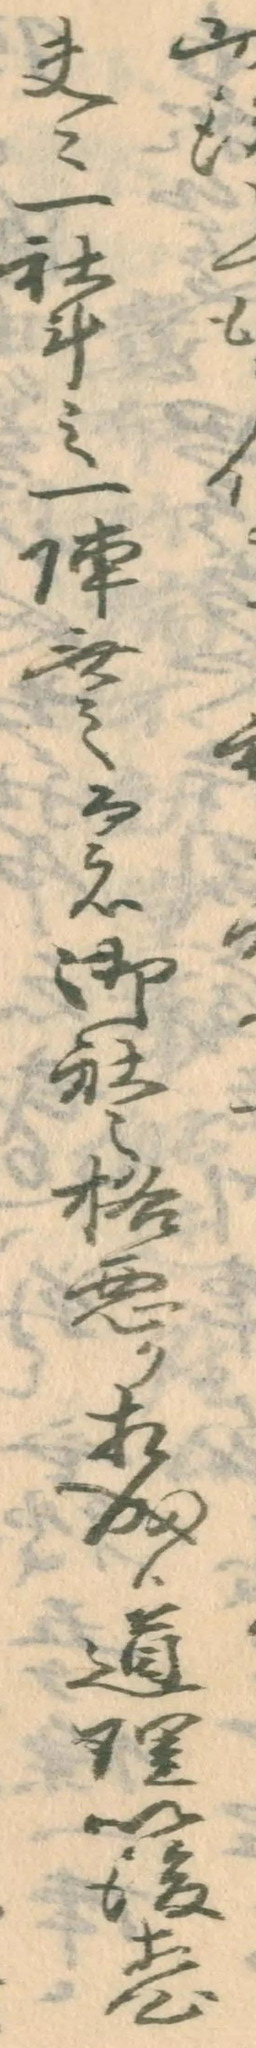夫々一社計之一陣無之而は御社之格悪ク相成候道理以後相心
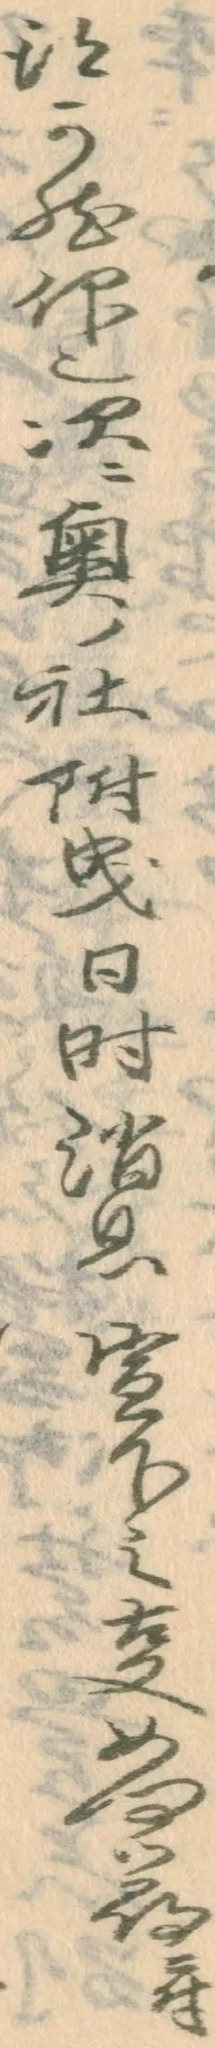得可然仰也次ニ奥ノ社附曳日時消息宣下之事如何御尋ニ付
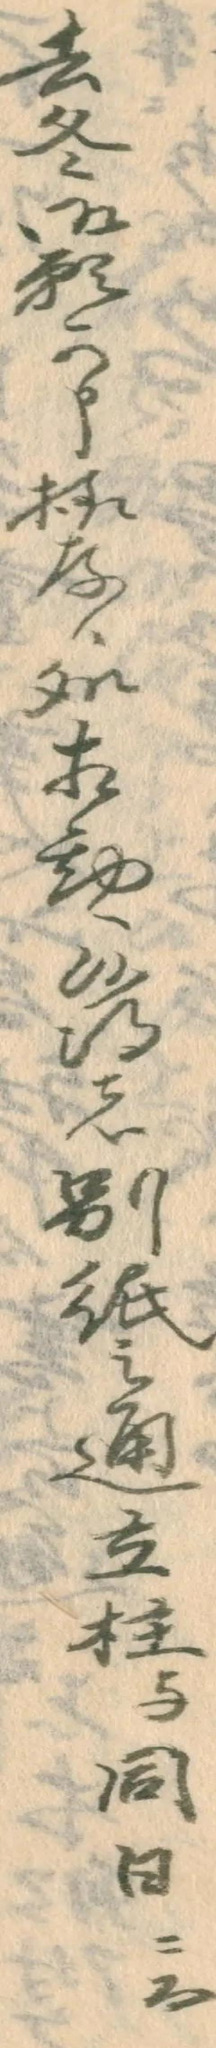去冬御願可申様存候処相勤へ候得は別紙之通立柱与同日ニ而
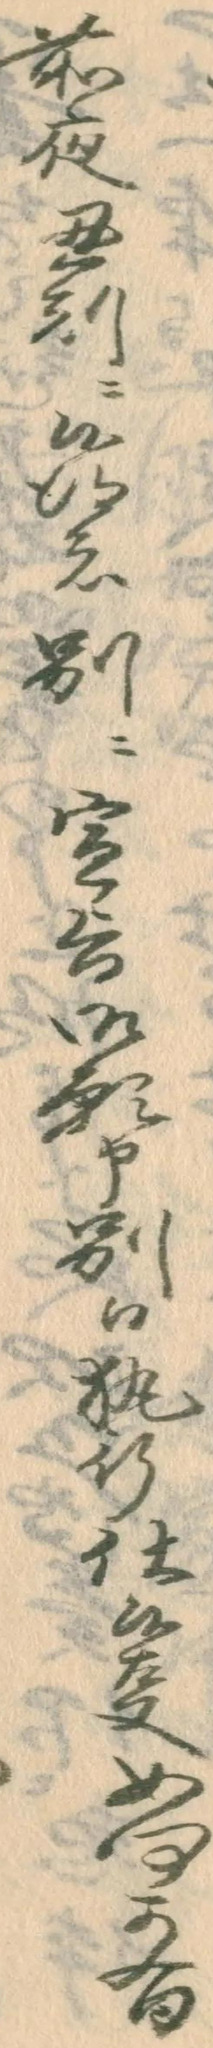前夜丑刻ニ候得は別ニ宣旨御願申別日執行仕候事如何可有
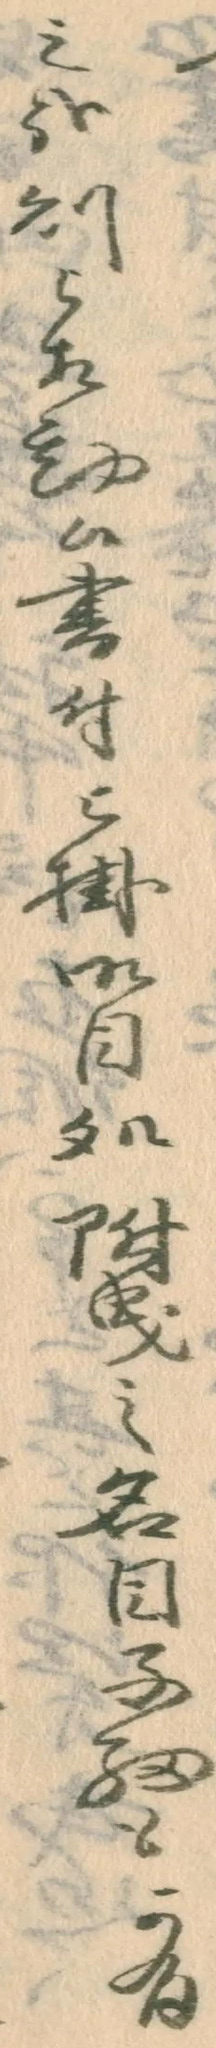之哉則被相勤候書付被掛御目処附曳之名目子細も可有
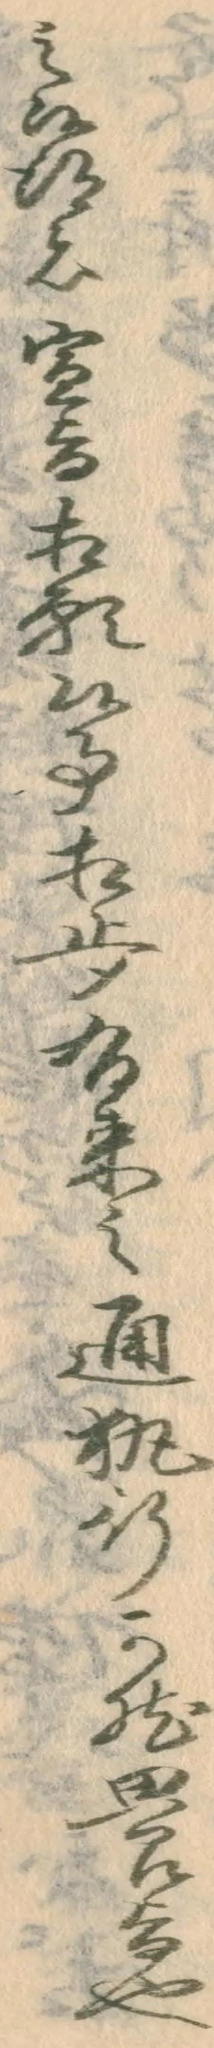之候得は宣旨相願候事相止メ有来之通執行可然思召旨也
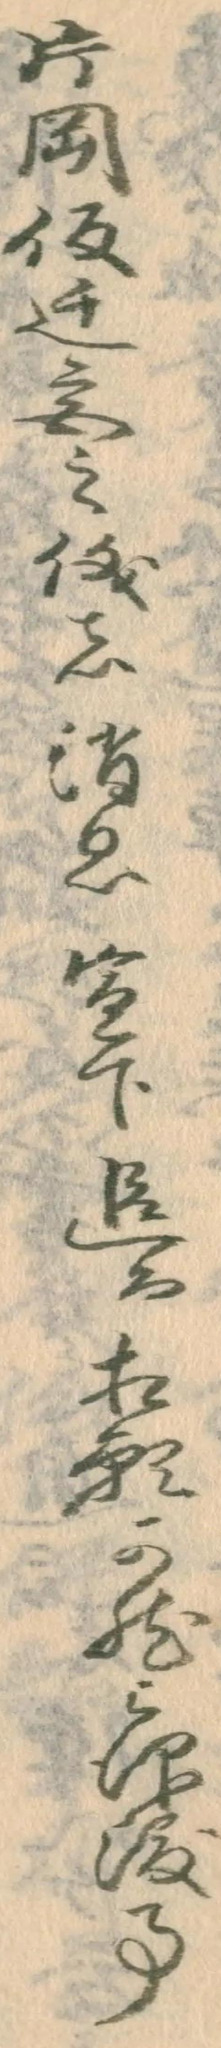片岡仮迁宮之儀は消息宣下追而相願可然被仰渡事
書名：賀茂社記録. 第17冊
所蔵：国立国会図書館 National Diet Library, JAPAN
